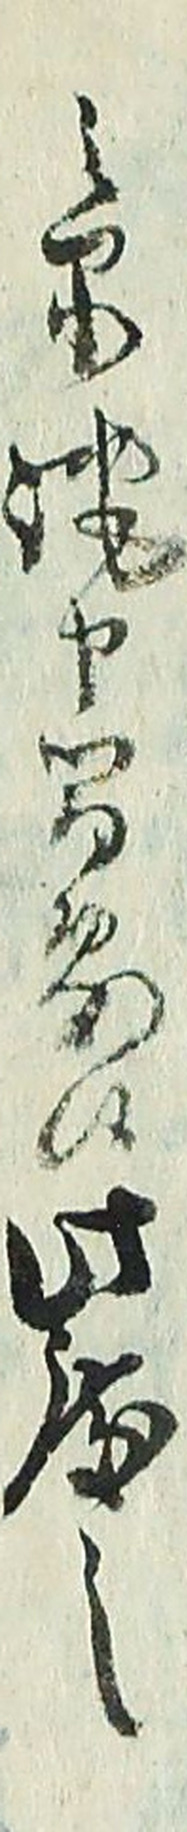之品誂申間敷候此度之
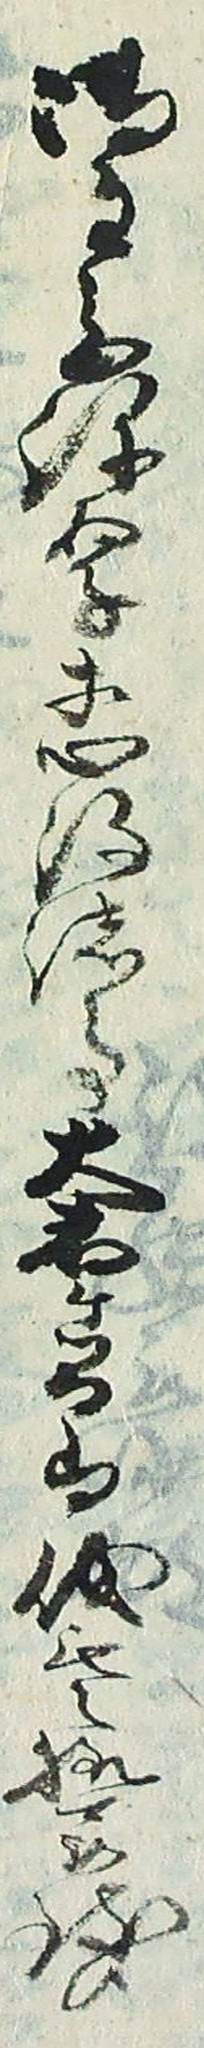御主意弥厚相心得諸事奢ヶ間布儀無之様可被致候
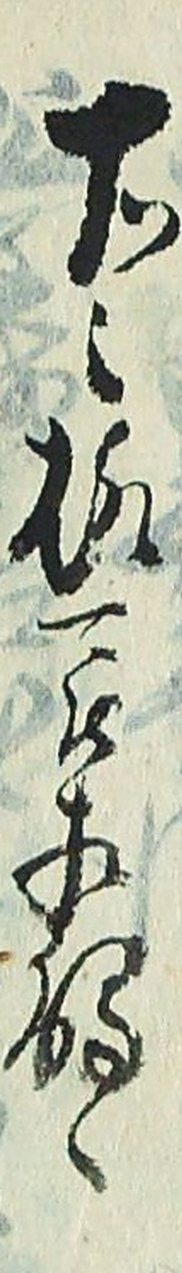右之趣可被相触候
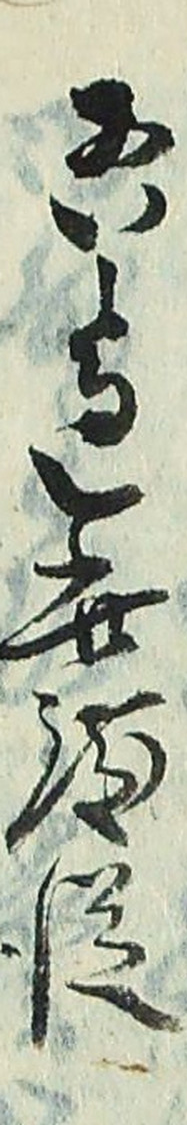右之通此度従
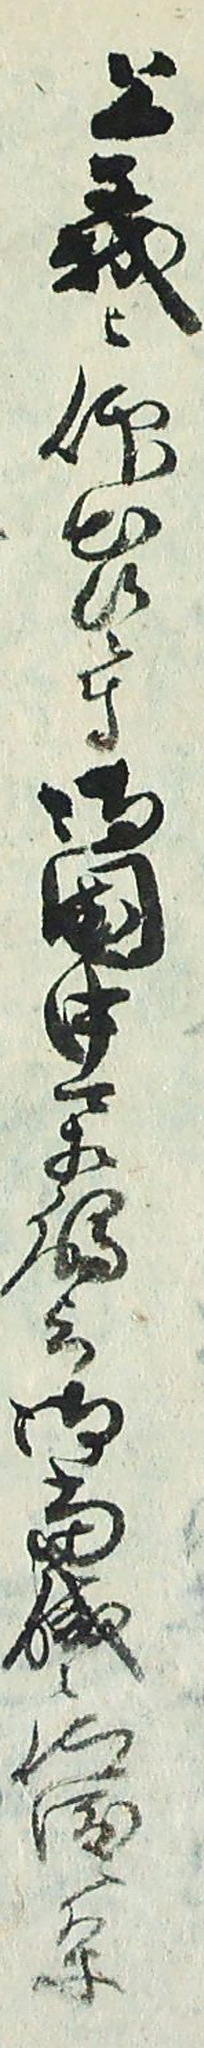公義被仰付候に付御国中可相触旨御当職被仰渡候条
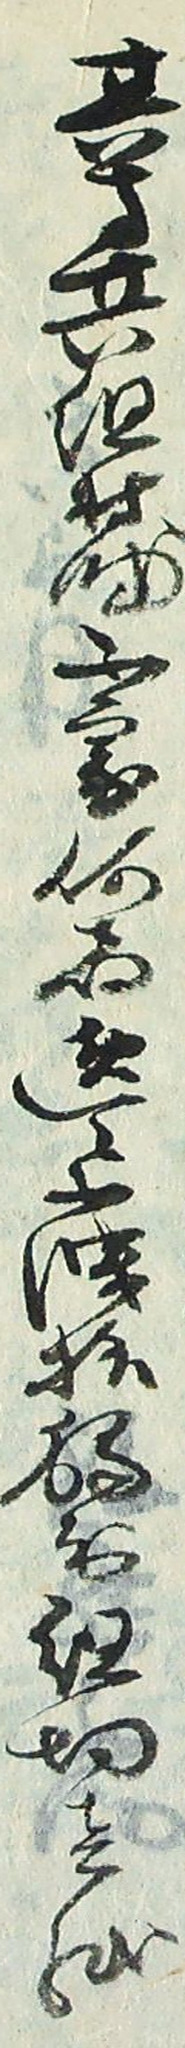其方共組村浦不寄何者逸々不洩様触知組切壱紙
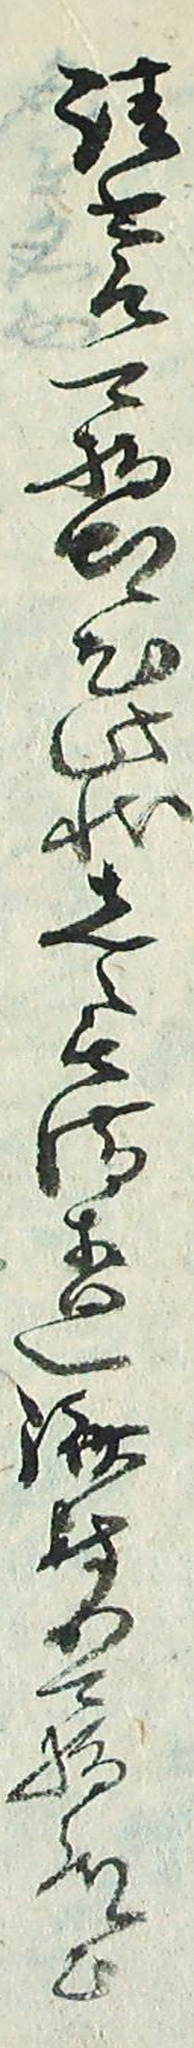請書取可指出候尤此状先々無滞相廻済村ゟ可指戻候以上
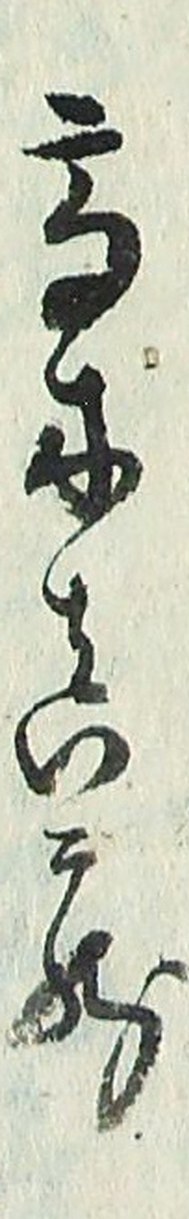高木真蔵
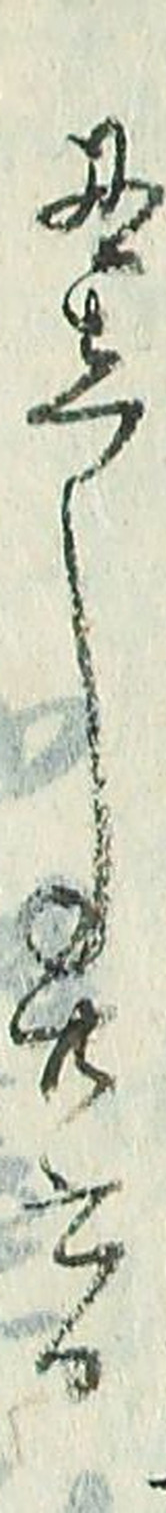丑十一月廿六日

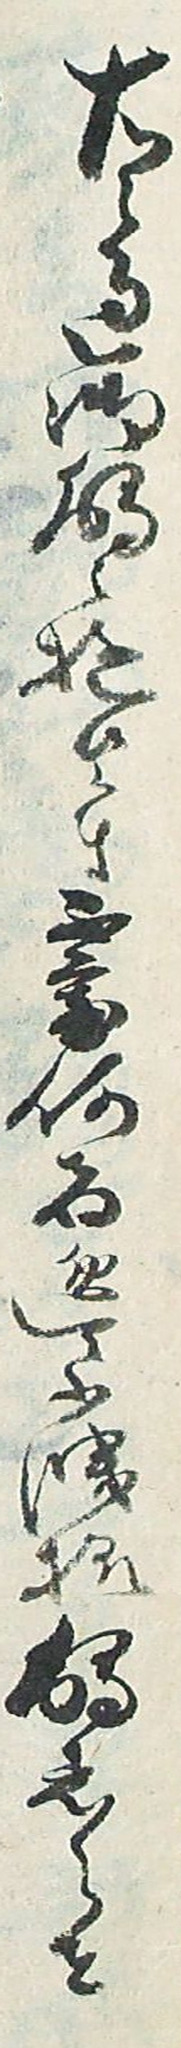右之通御触被遊候に付不寄何者逸々不洩様触知らせ
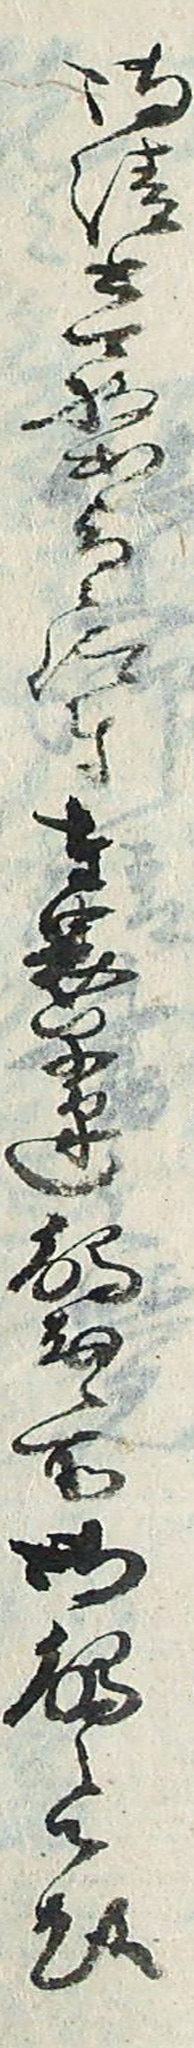御請書可指出旨被仰付奉畏早速触知候所御触之御趣
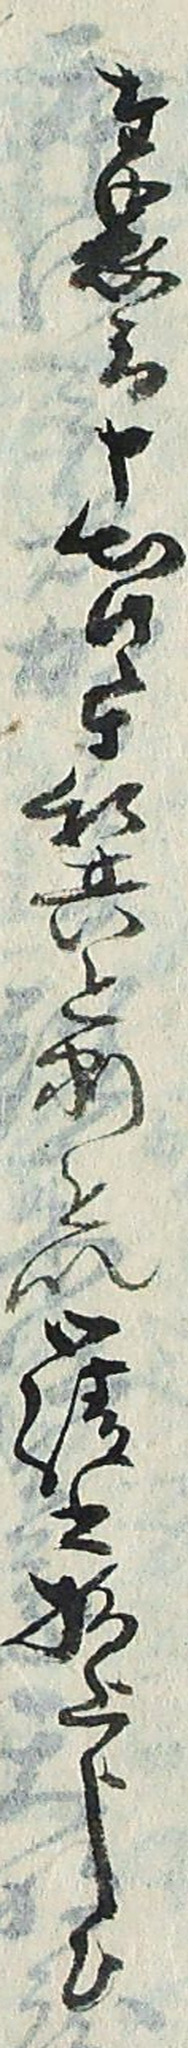奉畏旨申出候に付私共連判を以御請書指上申候以上
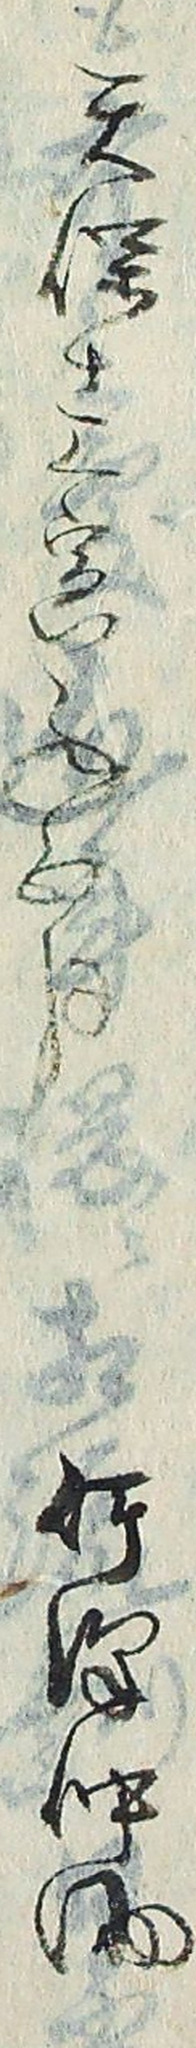天保十三寅年正月伊澤仲助
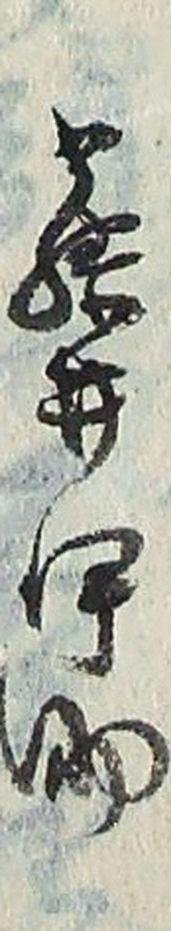藤井伊助
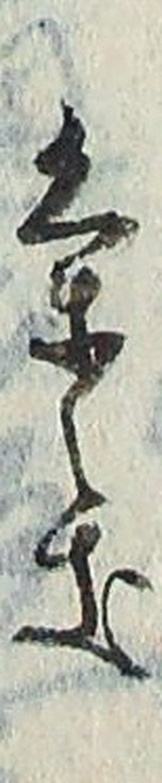久米之丈
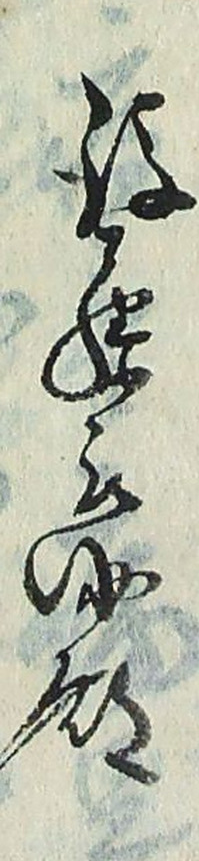後藤庄助殿
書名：諸御用御□受書控
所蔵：鳴門教育大学 Naruto University of Education
